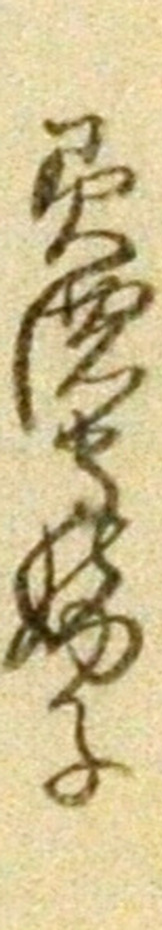美濃守嫡子
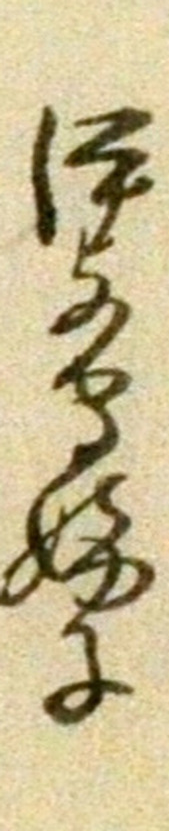筑前守嫡子
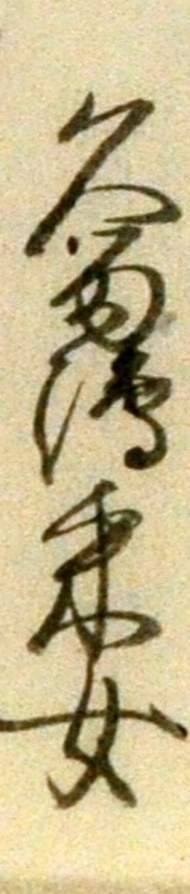久留嶋采女
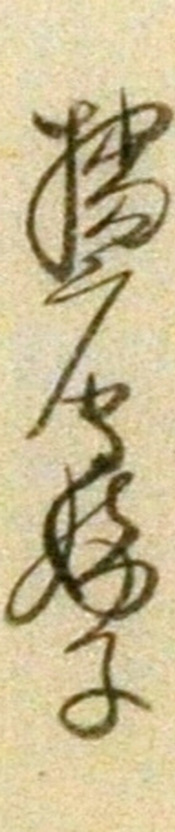播磨守嫡子

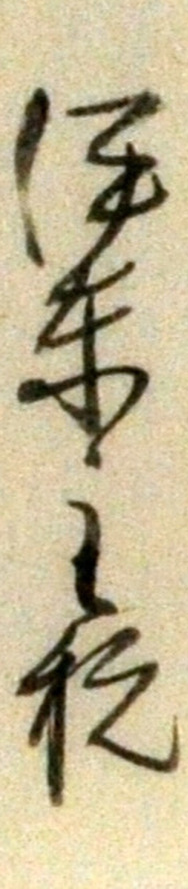伊東主税
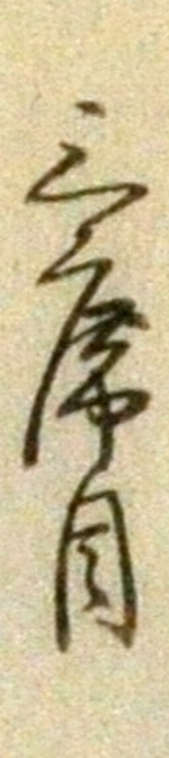三席目
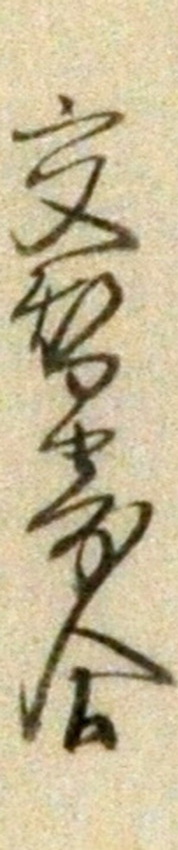交替寄合
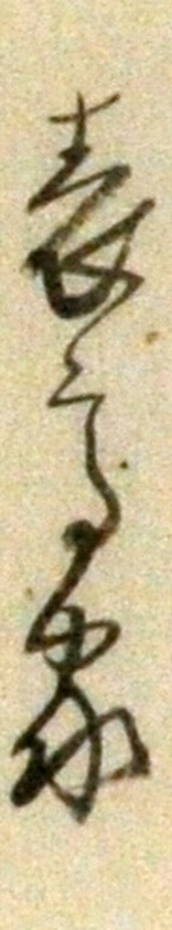表高家
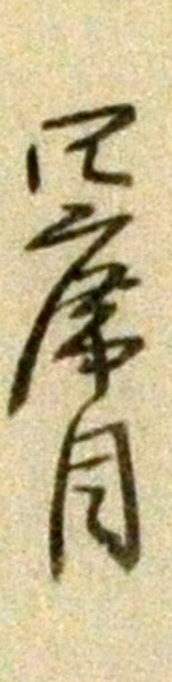四席目
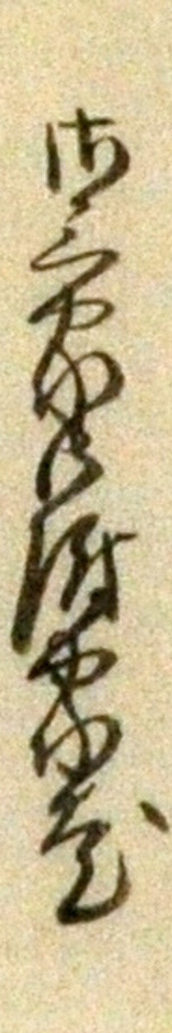御三家御附家老
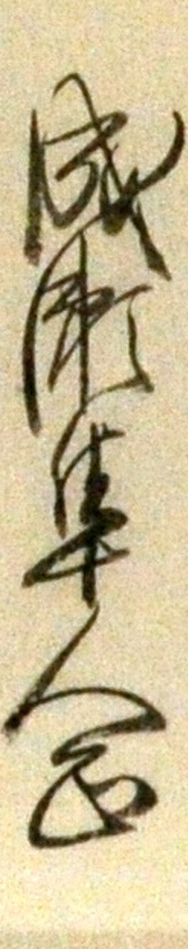成瀬隼人正
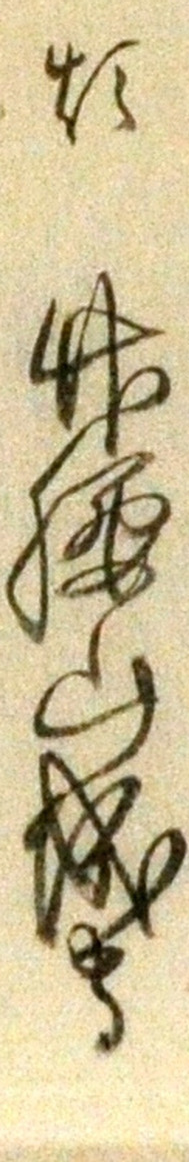煩竹腰山城守
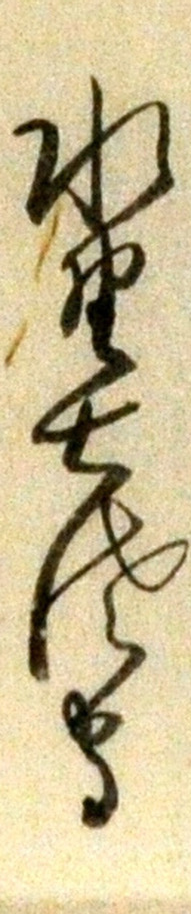水野土佐守
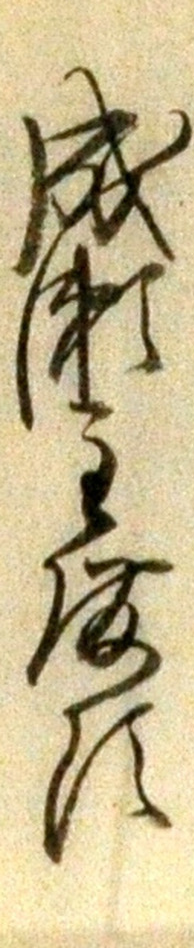成瀬主殿頭
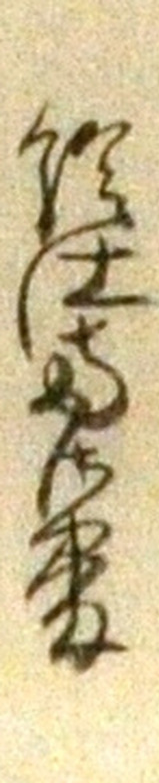給仕両御番
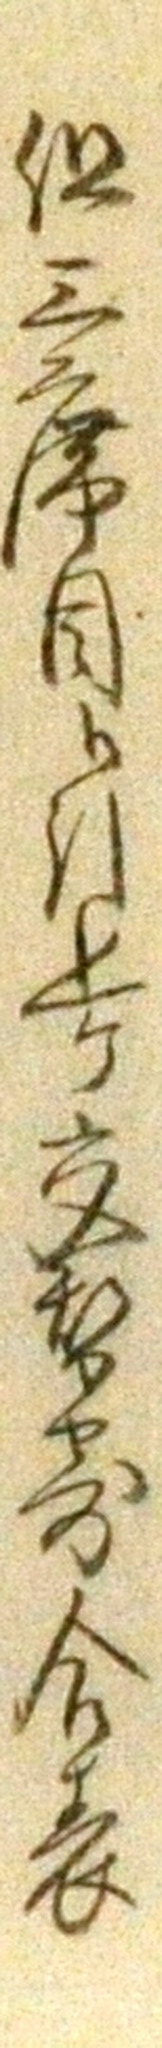但三席目え引上ケ交替寄合表
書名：御馳走御能ノ節ノ留外
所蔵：伊那市立高遠町図書館・合同会社AMANE
